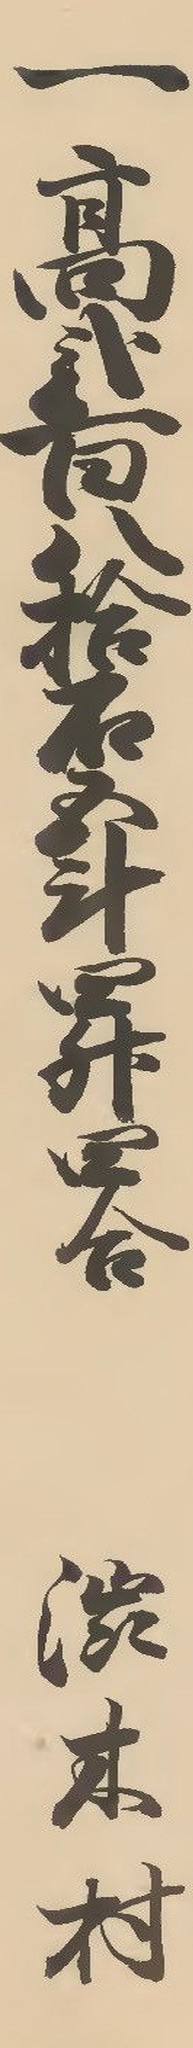一髙弐百八拾石五斗四升四合渋木村
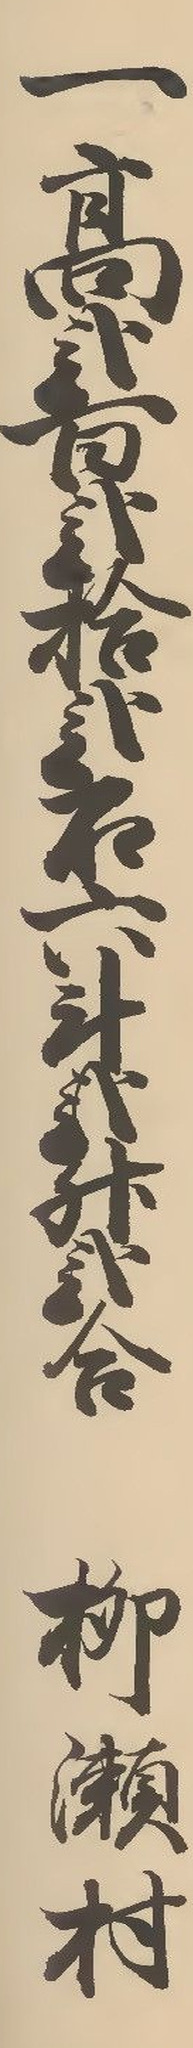一髙弐百弐拾弐石六斗弐升弐合柳瀬村
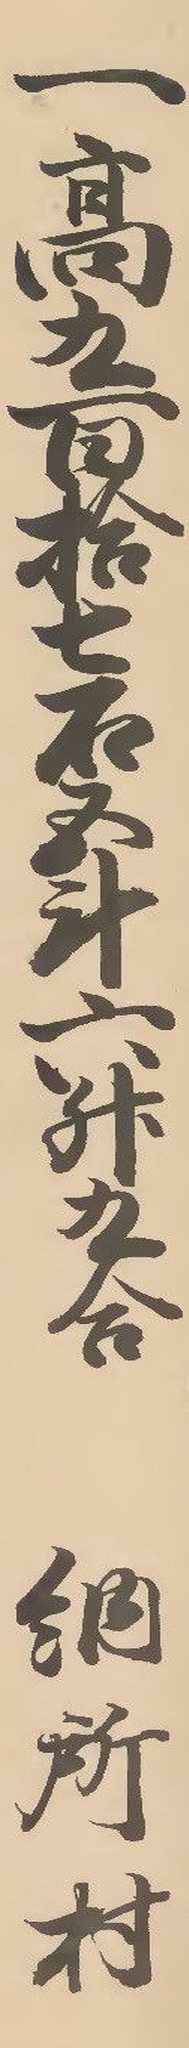一髙九百拾七石五斗六升九合納所村
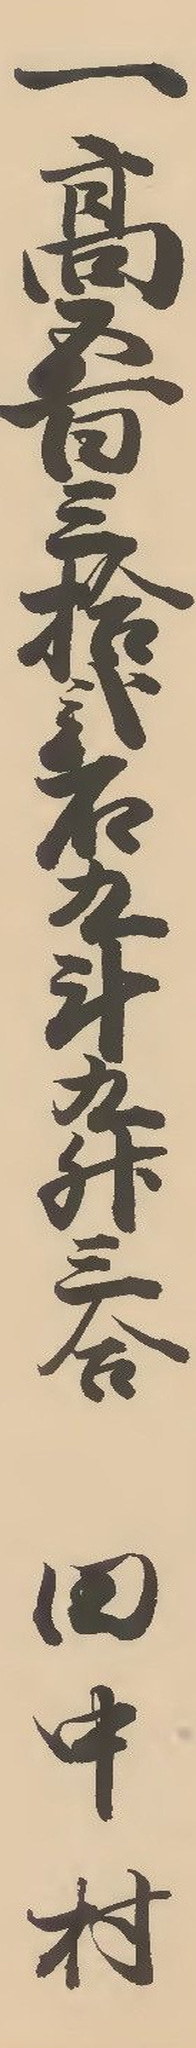一髙五百三拾弐石九斗九升三合田中村
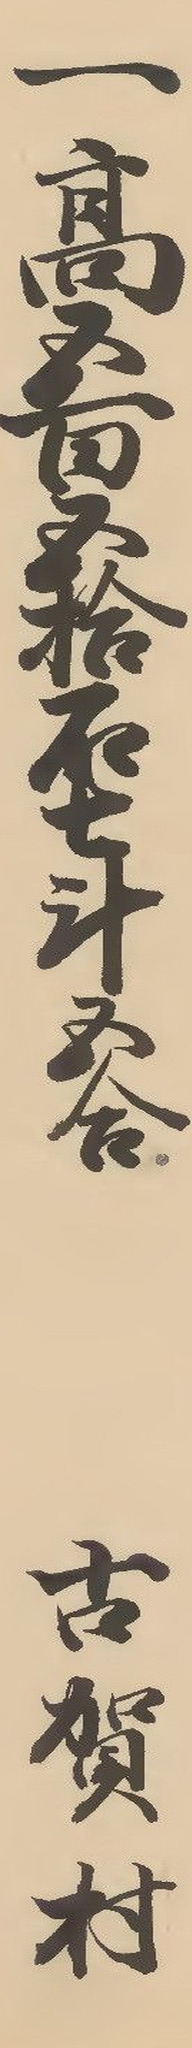一髙五百五拾石七斗五合古賀村
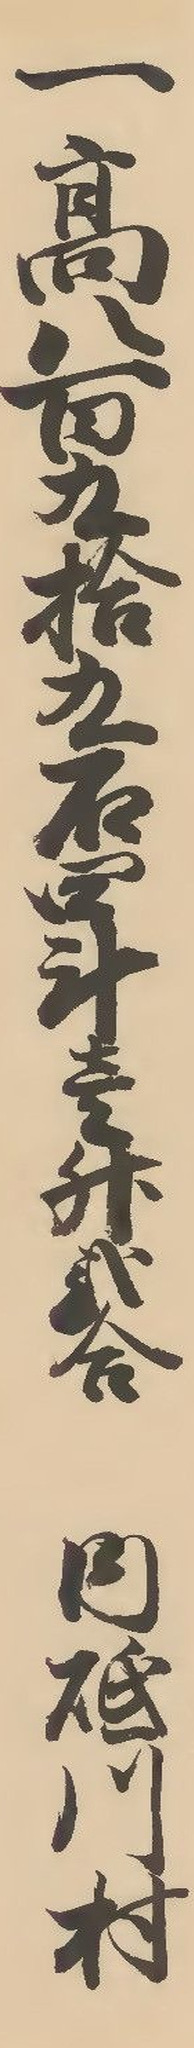一髙八百九拾九石四斗壱升弐合内砥川村

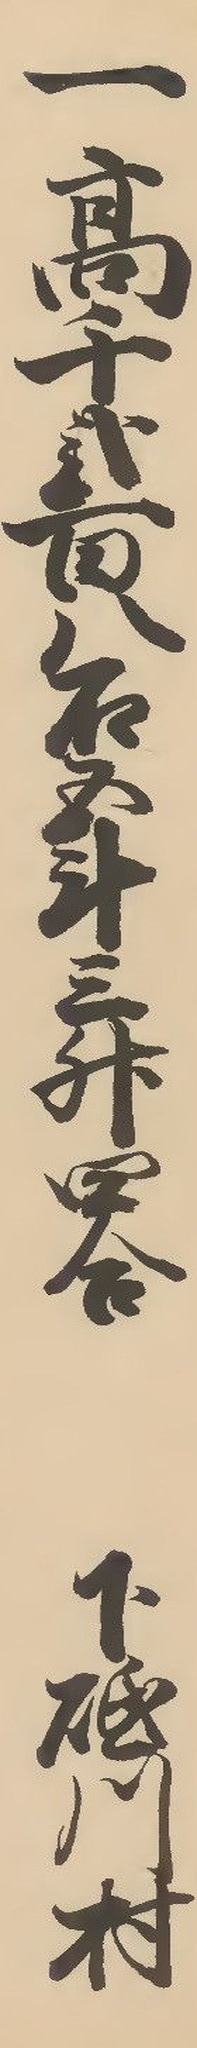一髙千弐百八石五斗三升四合下砥川村
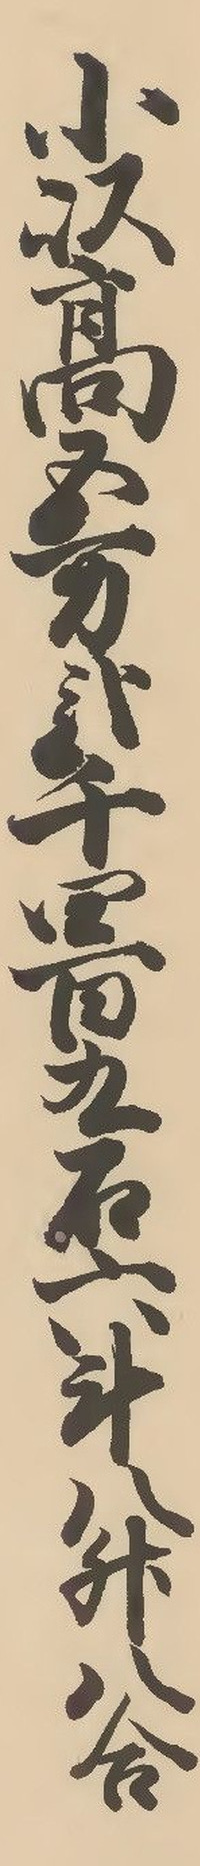小髙以五万弐千四百九石六斗八升八合
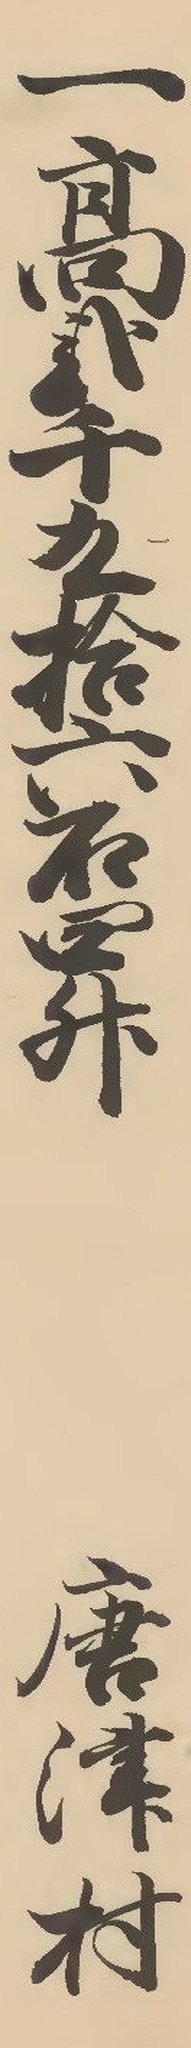一髙弐千九拾六石四升唐津村
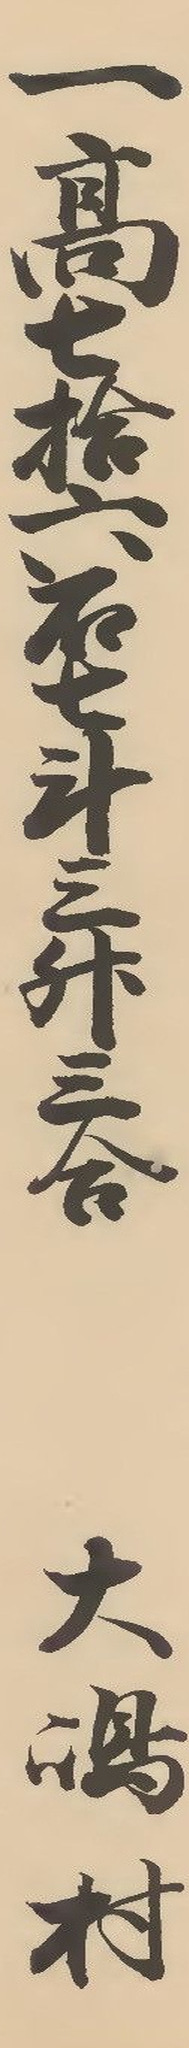一髙七拾六石七斗三升三合大嶋村
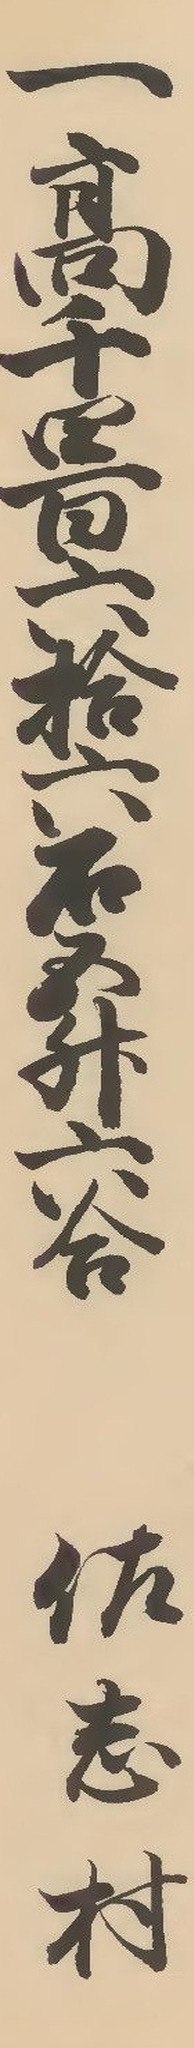一髙千四百六拾六石五升六合佐志村

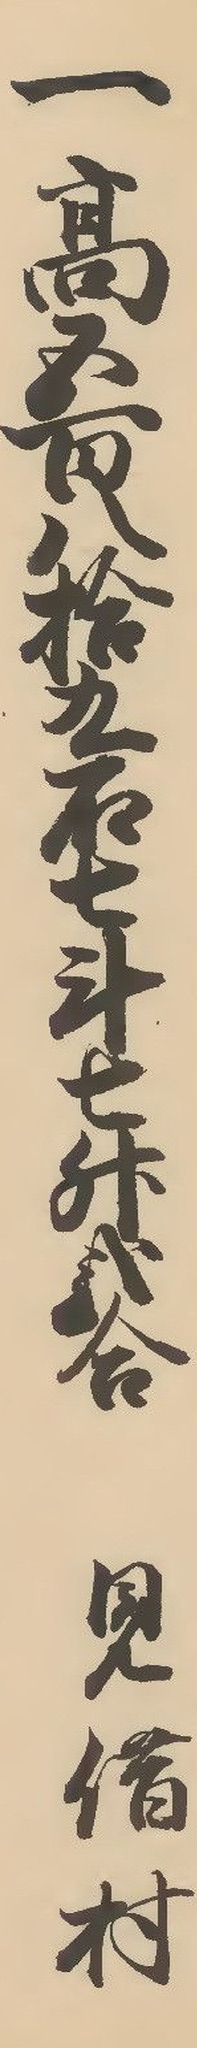一髙五百八拾九石七斗七升弐合見借村
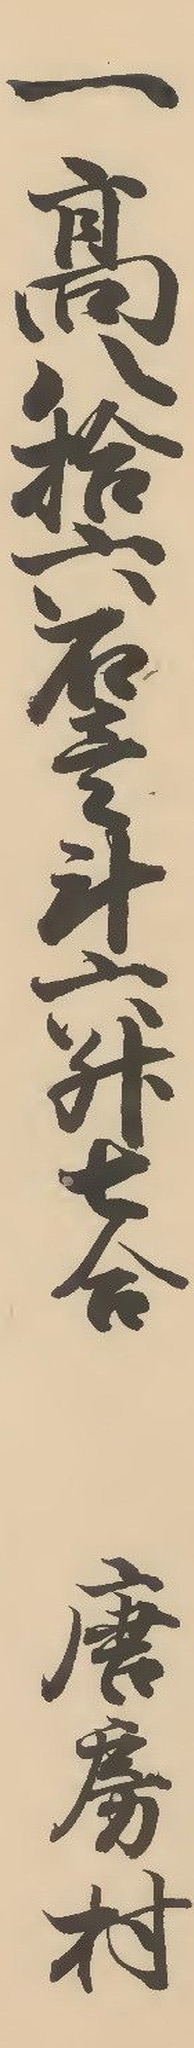一髙八拾六石壱斗六升七合唐房村
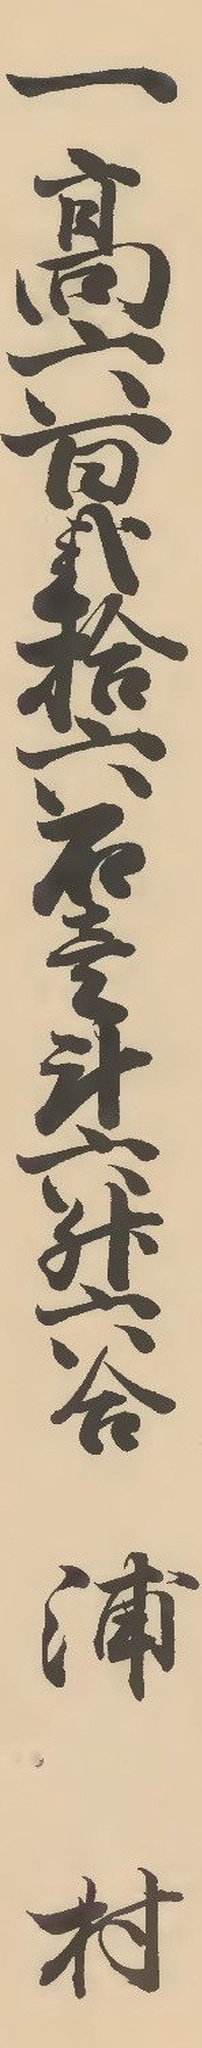一髙六百弐拾六石壱斗六升六合浦村
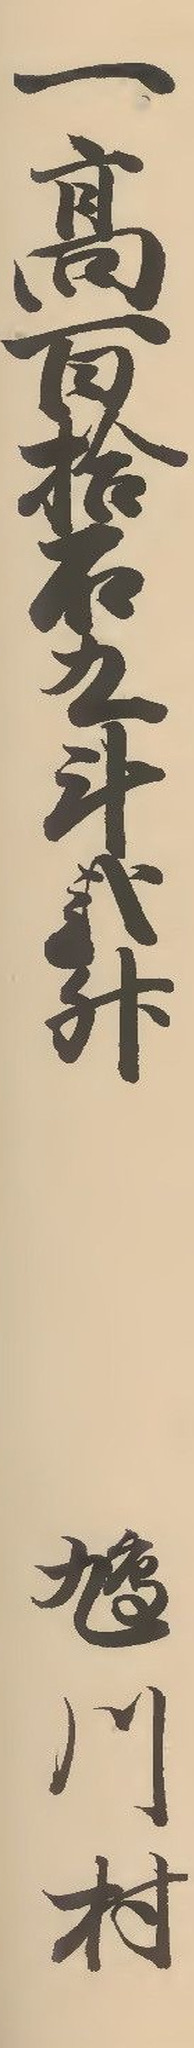一髙百拾石九斗弐升鳩川村
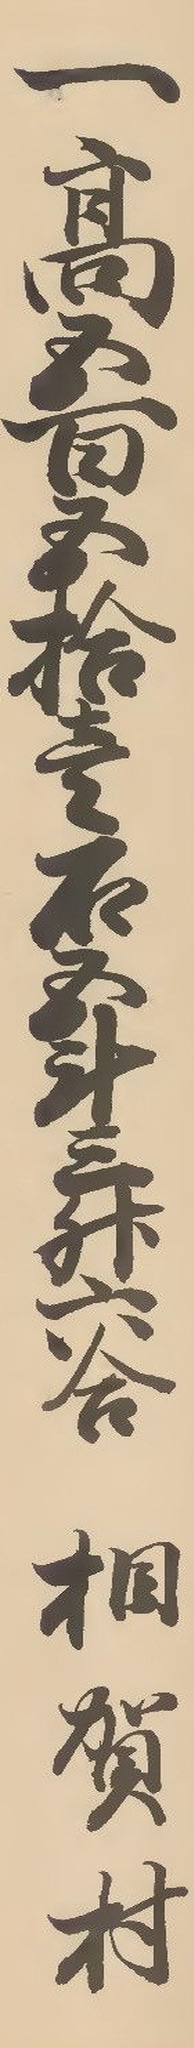一髙五百五拾壱石五斗三升六合相賀村
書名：肥前国郷帳
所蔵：国立公文書館 National Archives of Japan
